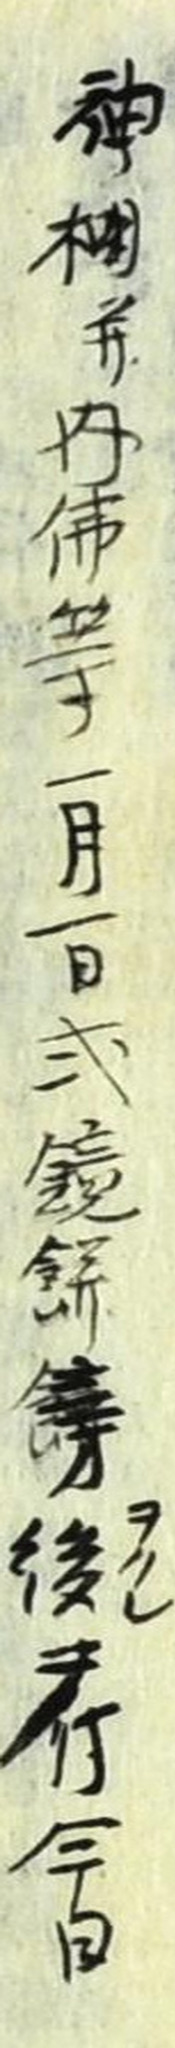神棚幷内仏等一月一日式鏡餅飾後ニ付今日
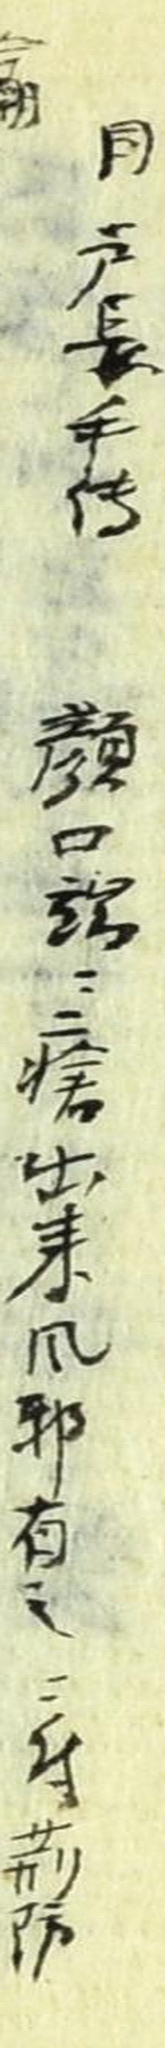同戸長手伝顔口端ニ瘡出来風邪有之ニ付荊防
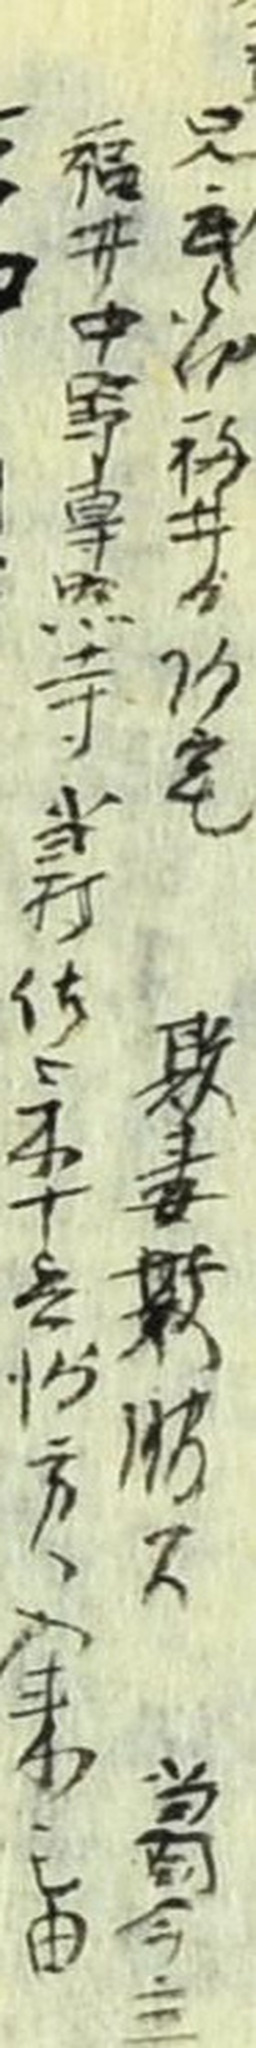福井中野専照寺当村佐々木十兵衛方へ入来之由
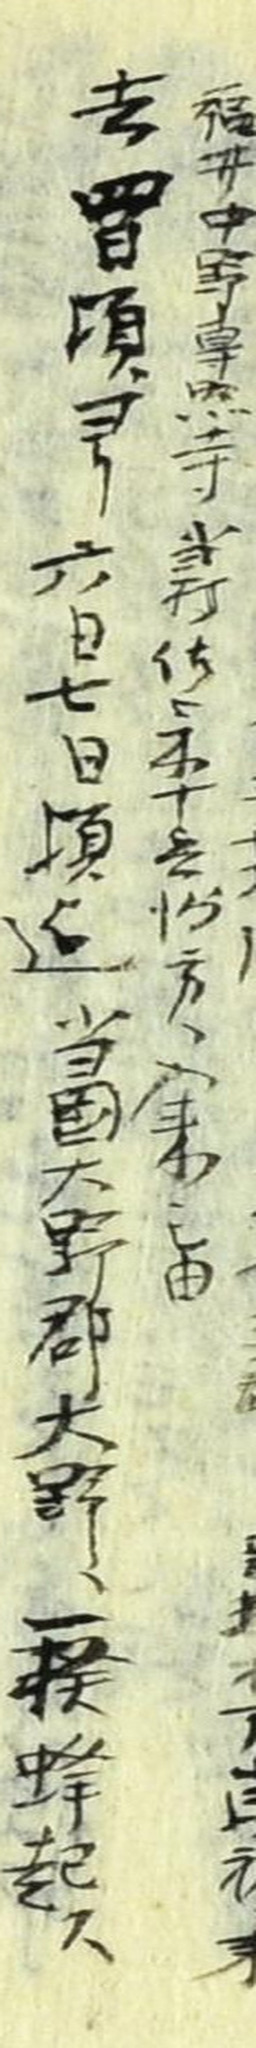去四日頃ヨリ六日七日頃迄当国大野郡大野へ一揆蜂起ス
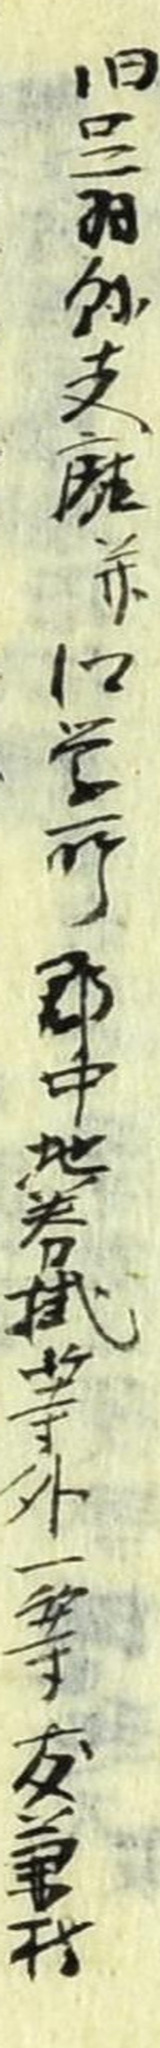旧足羽県支庁幷郷学所郡中地券掛等外一等友兼村
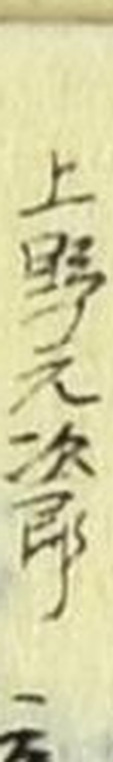上野元次郎
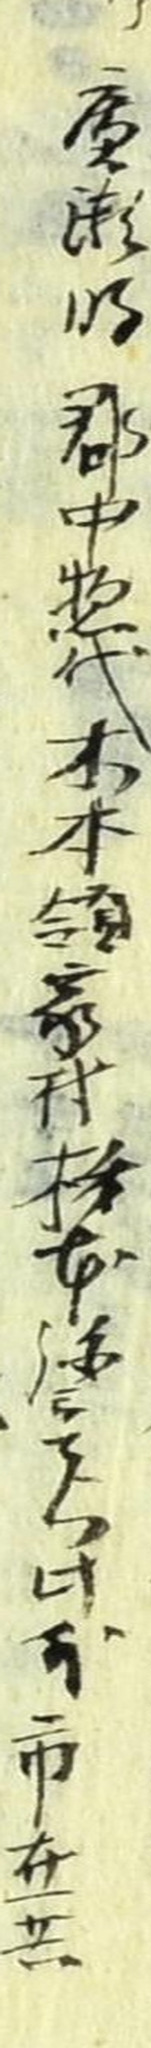広瀬明郡中惣代木本領家村杉本弥三右衛門此外市在共
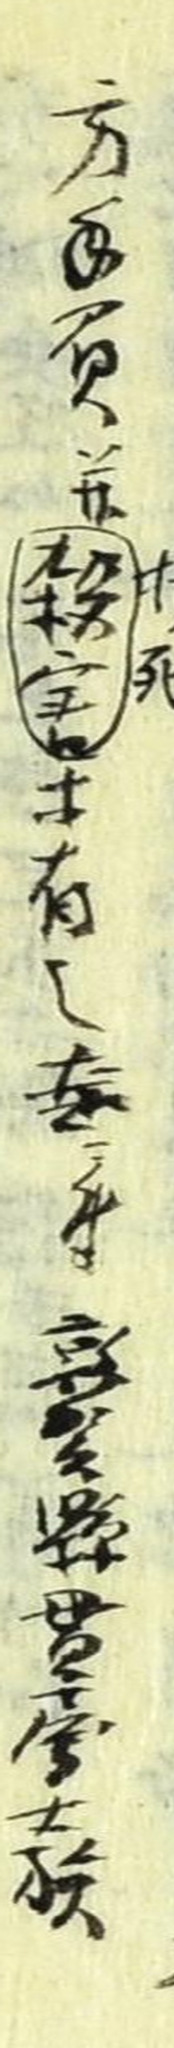方手負幷打死等有之趣ニ付敦賀県貫属士族
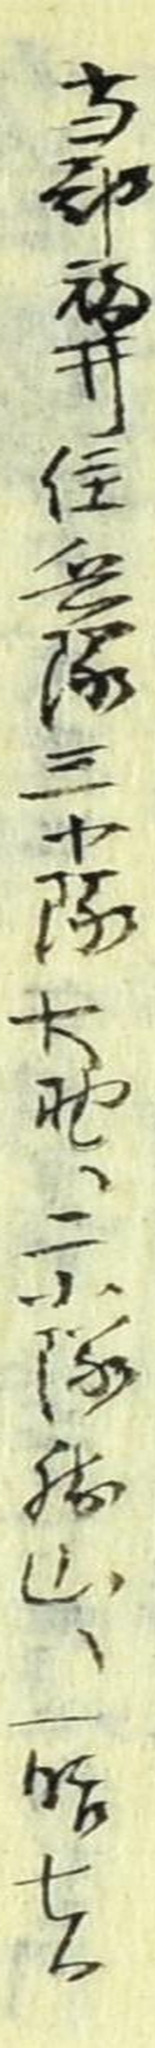当郡福井住兵隊三小隊大野へ二小隊勝山へ一昨七日
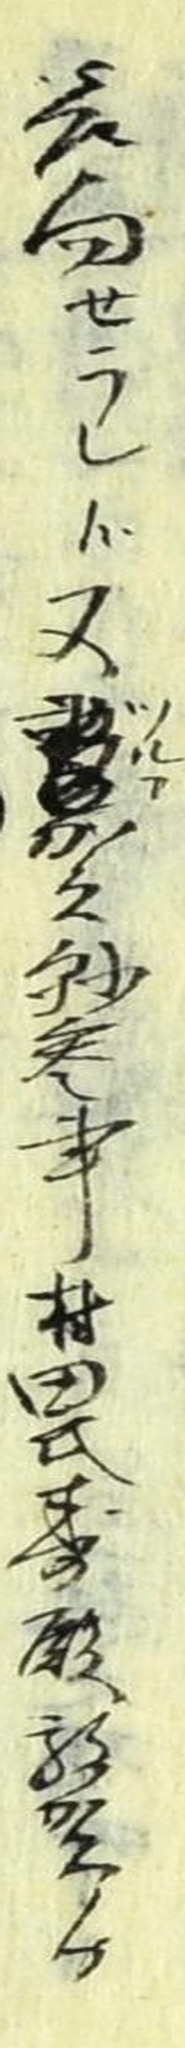差向セラレ候又敦賀県参事村田氏寿殿敦賀ゟ
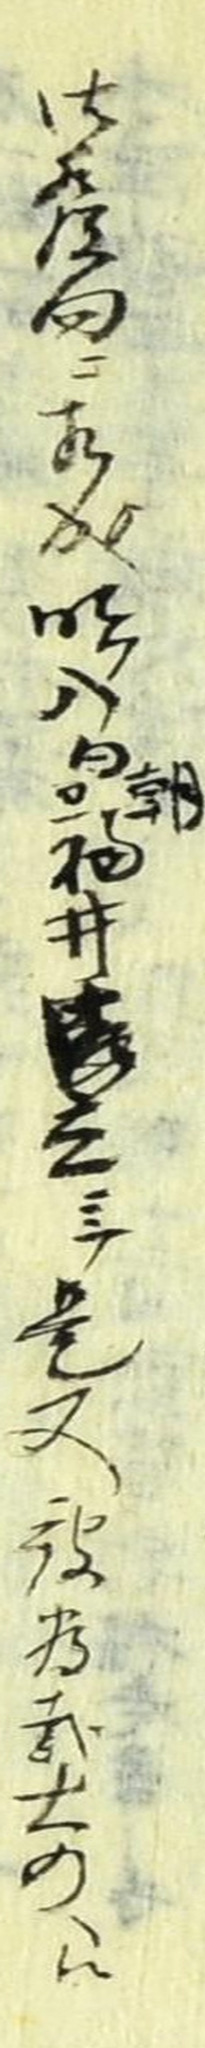御発向ニ相成昨八日「朝」福井御立ニテ是又被為赴大のへ候
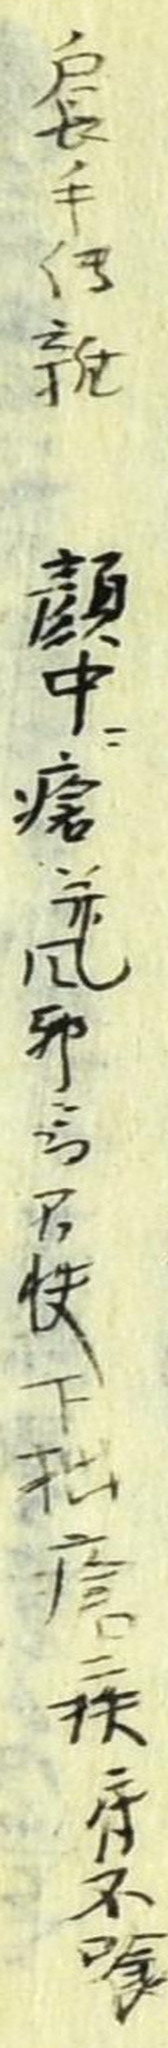戸長手伝雑顔中ニ瘡幷風邪ニ而不快下拙瘡疾ニ付不喰

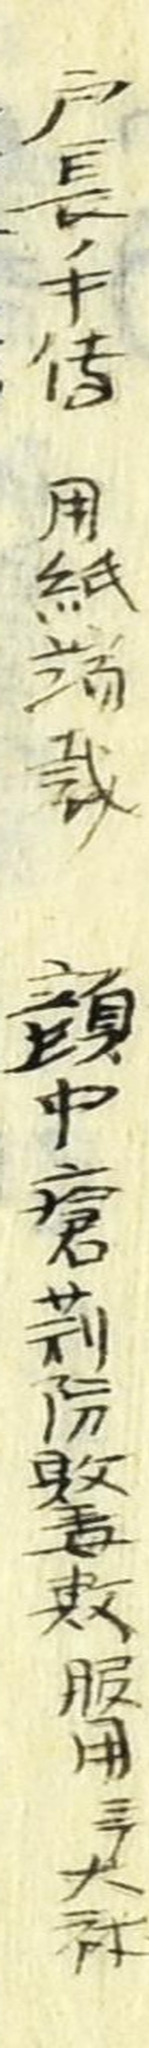戸長手伝用紙端裁顔中瘡荊防敗毒敷服用ニテ大祓
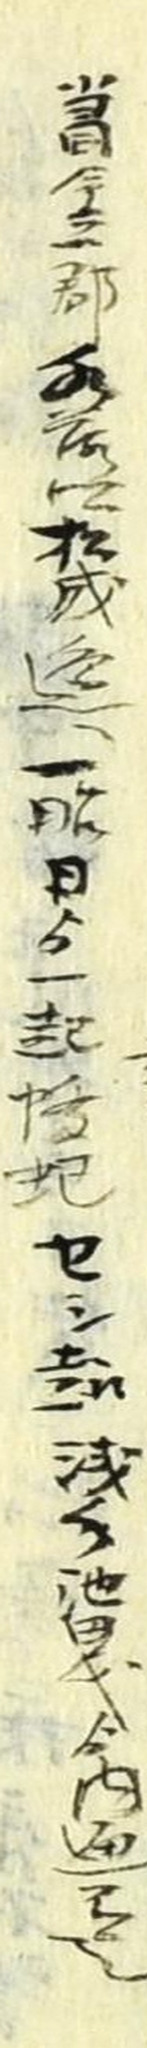当今立郡水落郷松成辺へ一昨日ゟ一起蜂起セシ趣浅水池田氏ゟ内通有之
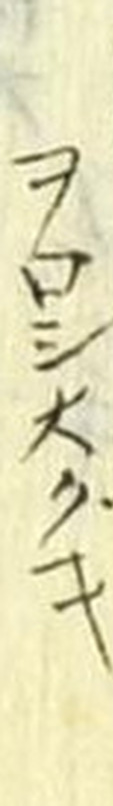夕ヲロシ大グキ
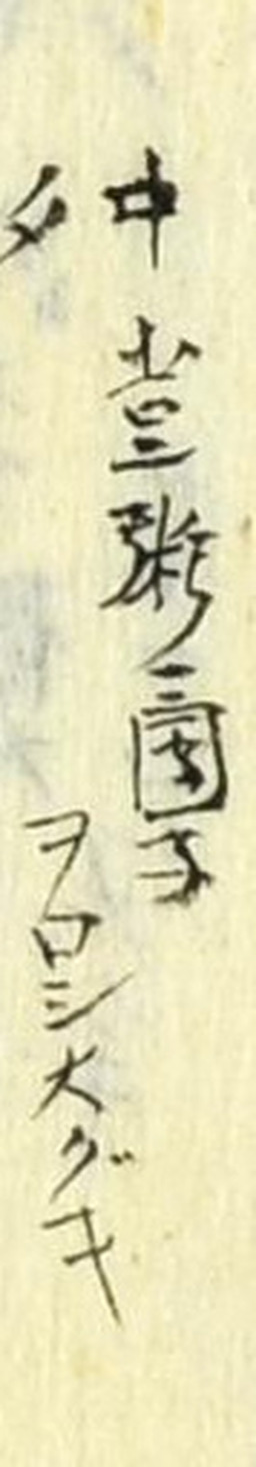夕ヲロシ大グキ
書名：（日記）
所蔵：福井県文書館 Fukui Prefectural Archives
